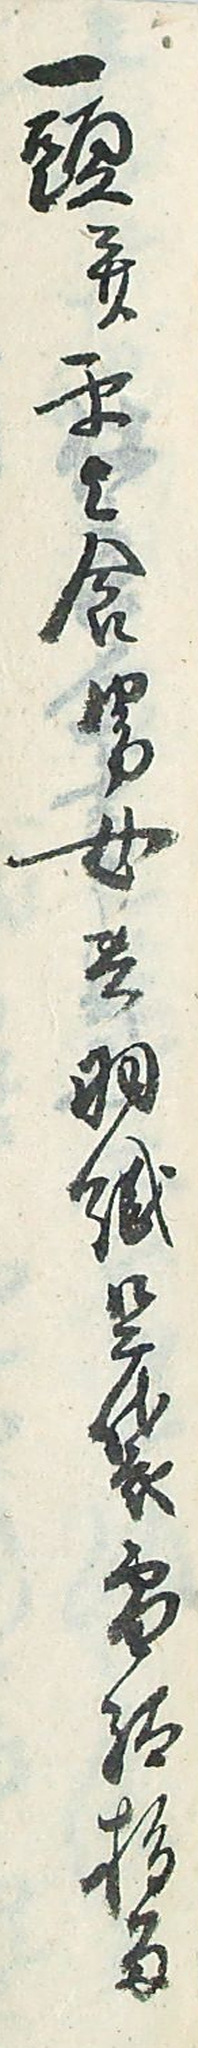一頭幷平乞食男女共羽織足袋雪駄指留
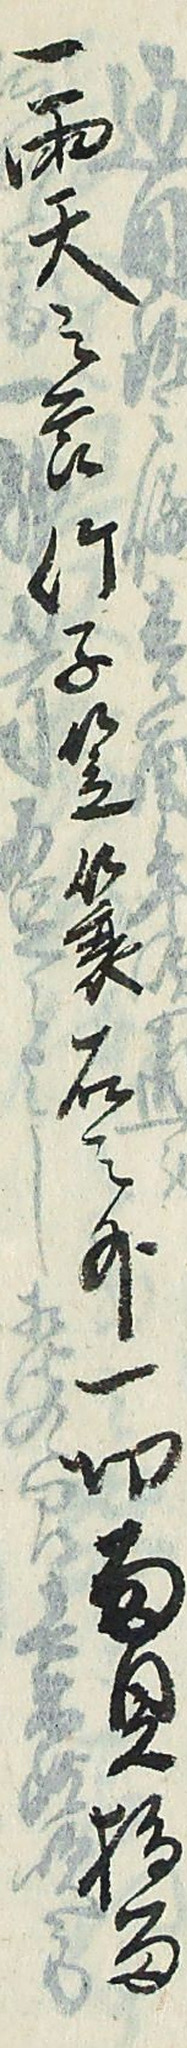一雨天之節竹子笠蓑右之外一切雨具指留
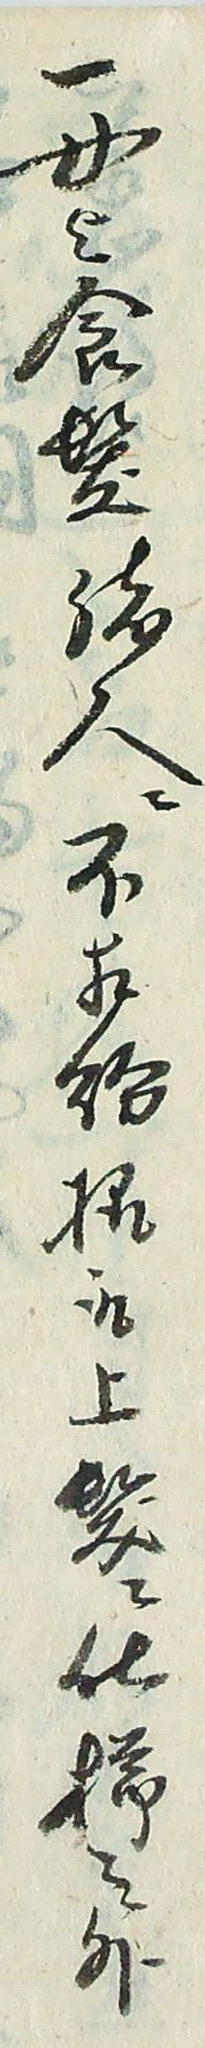一女乞食髪結人に不相紛様取上髪に仕櫛之外
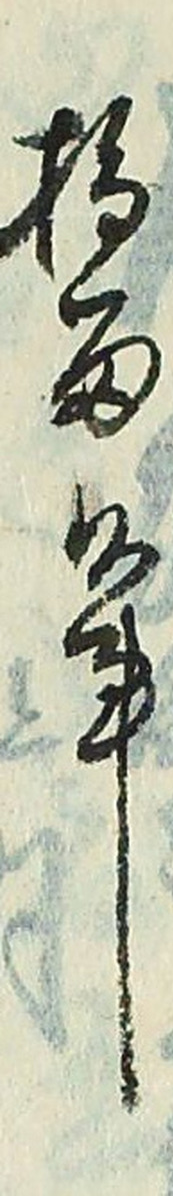指留候事
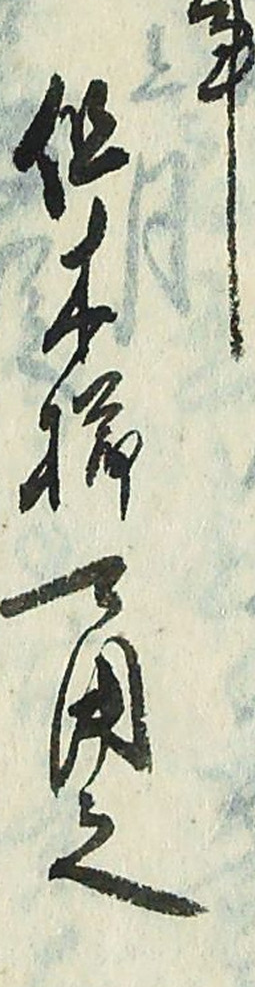但木櫛可用之
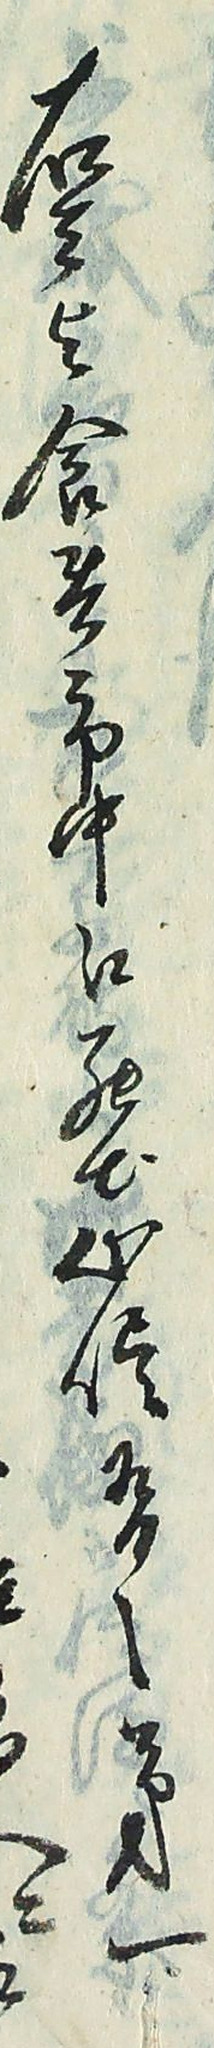右は乞食共市中え罷出心侭有之第一
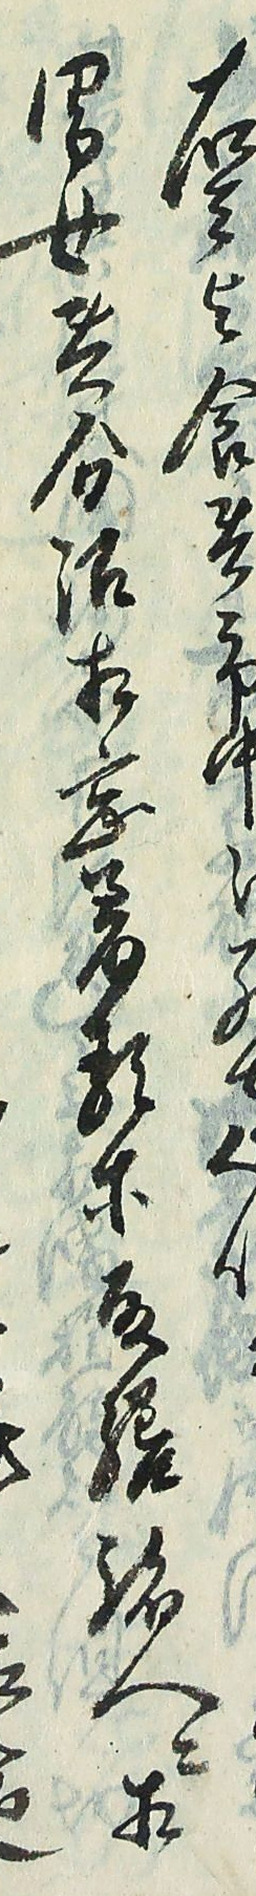男女共分限相忘着類等取繕諸人に相
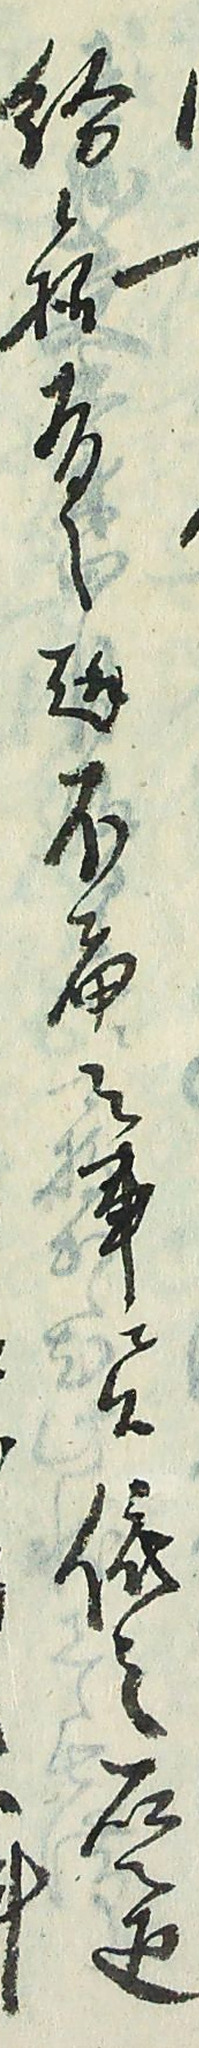紛候様有之趣不届之事に候依之右之通
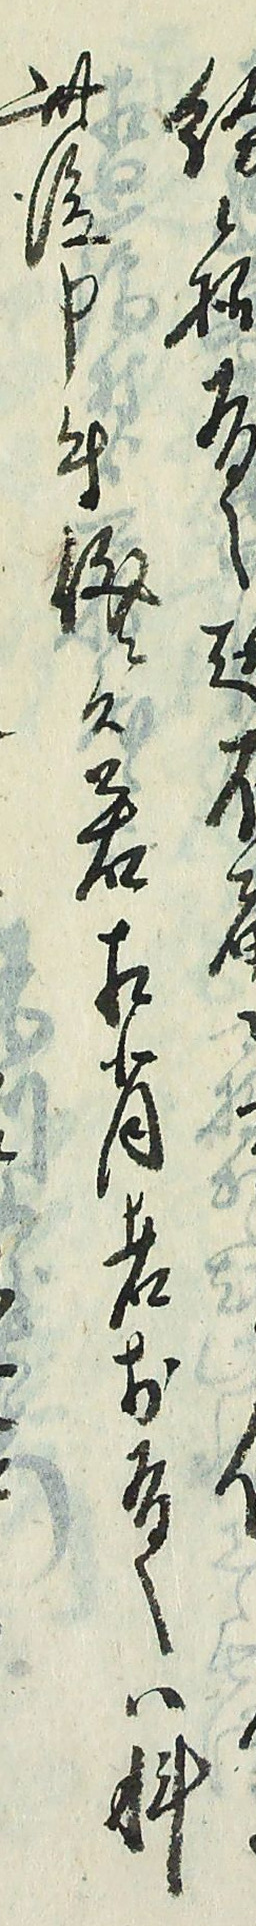此後申付儀に候若相背者於有之は科
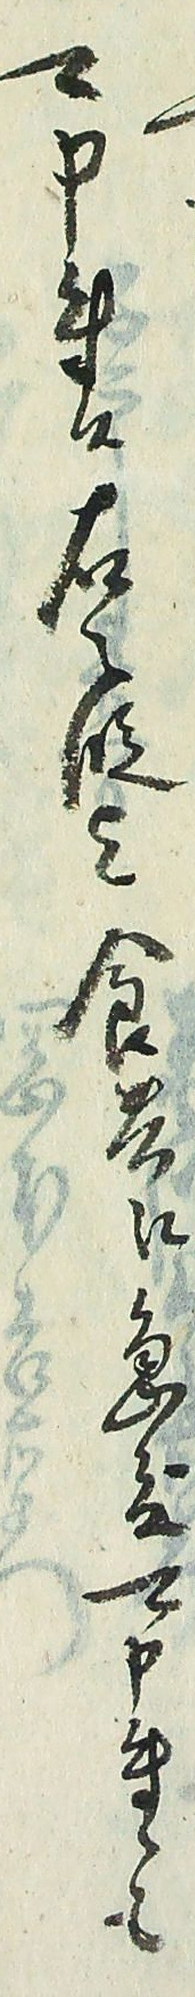可申付候右之段乞食共え急度可申付候以上
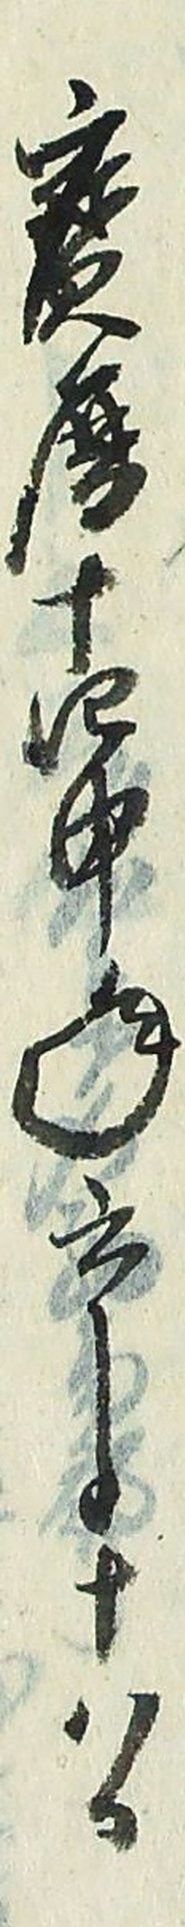宝暦十四申年六月十八日

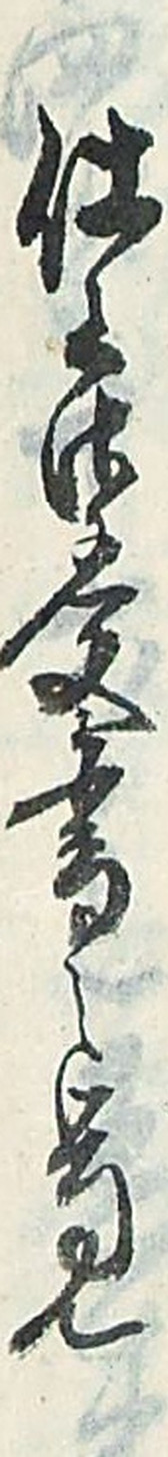仕上御受書之覚
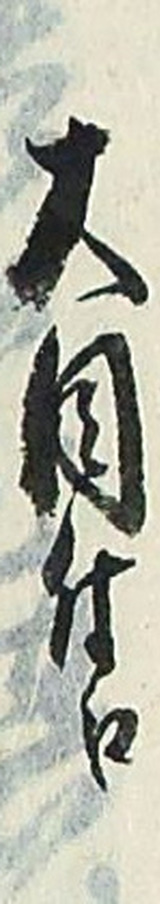大目付江
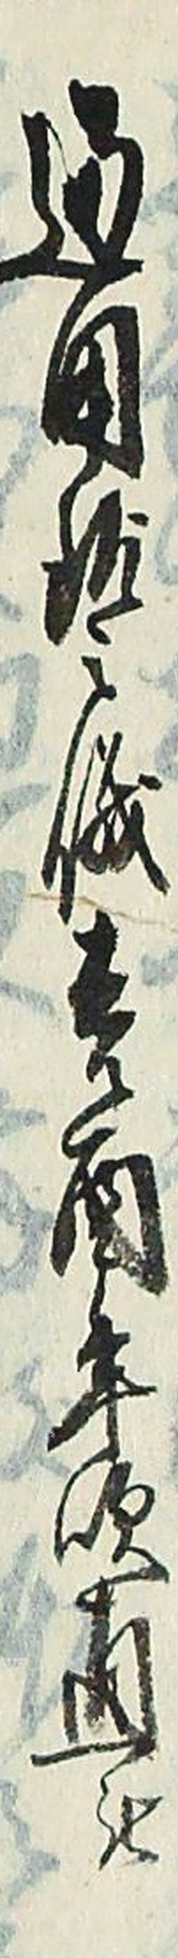通用銀之儀去る酉年吹直被
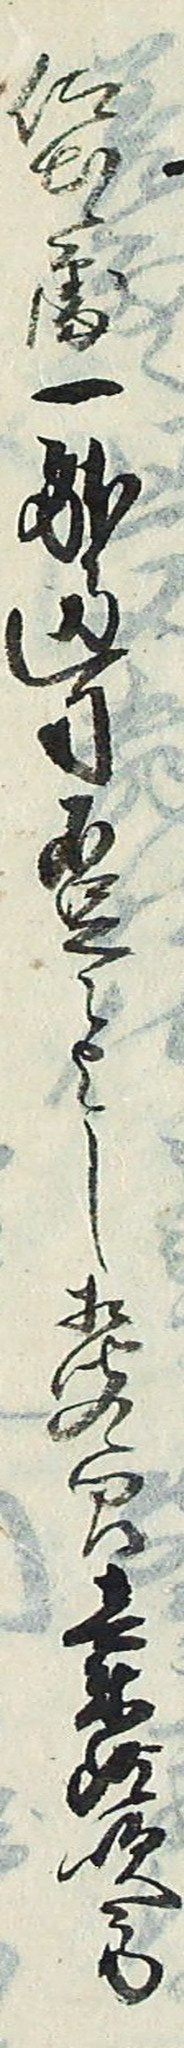仰出候処一体通用不足之よし相聞候間壱朱銀吹方
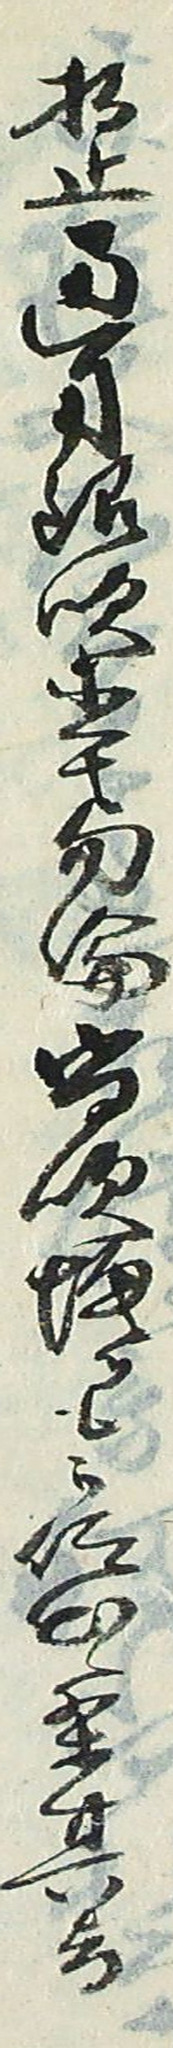指止通用銀吹直は勿論尚吹増をも被仰出候条其旨
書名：諸御用御□受書控
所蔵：鳴門教育大学 Naruto University of Education
